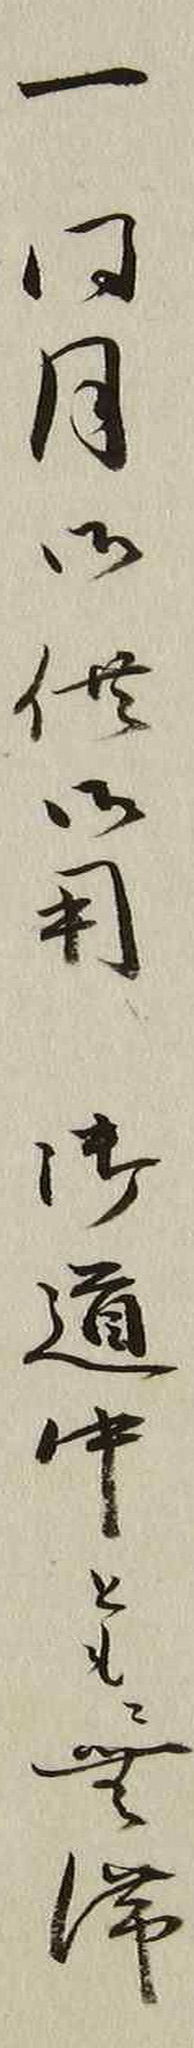一同月御供御用御道中ともニ無滞
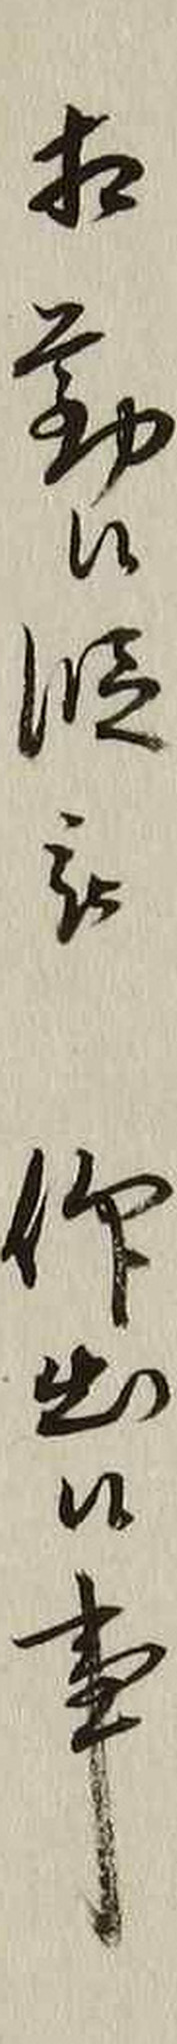相勤候段被仰出候事
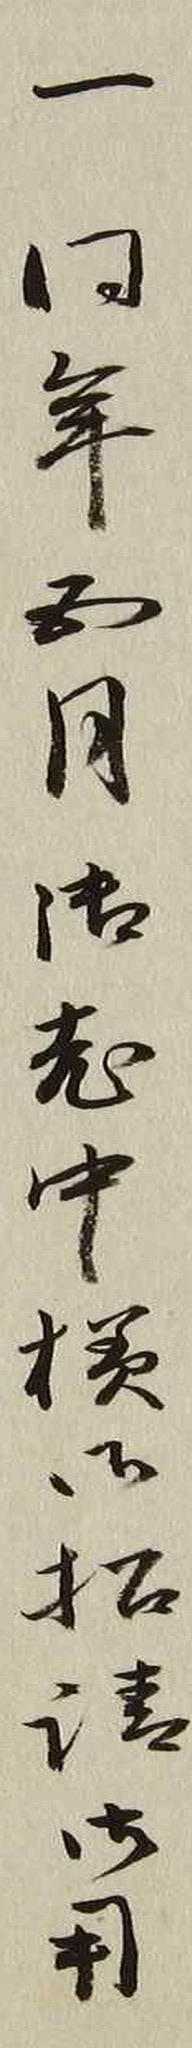一同年五月御老中様御招請御用
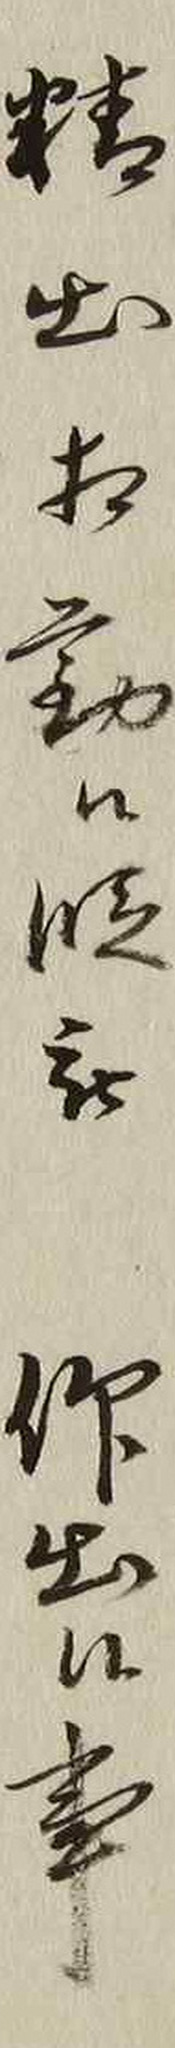精出相勤候段被仰出候事
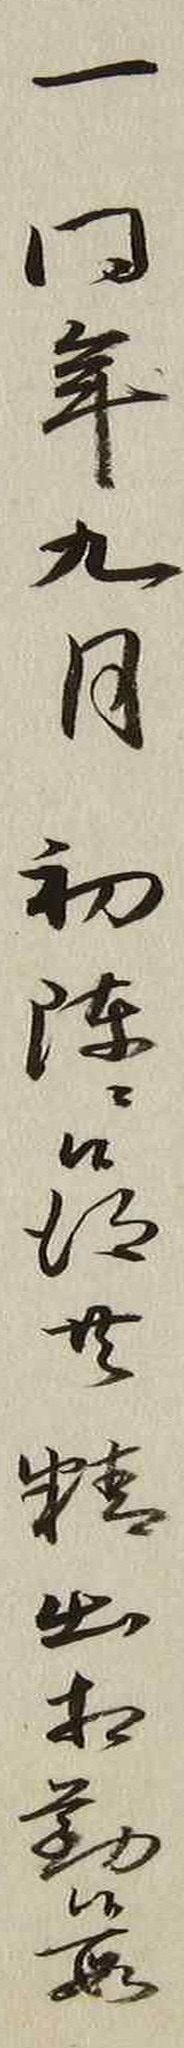一同年九月初陣ニ候得共精出相勤候段
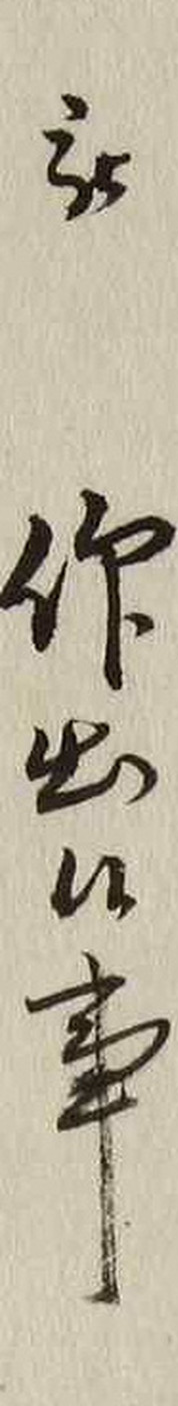被仰出候事
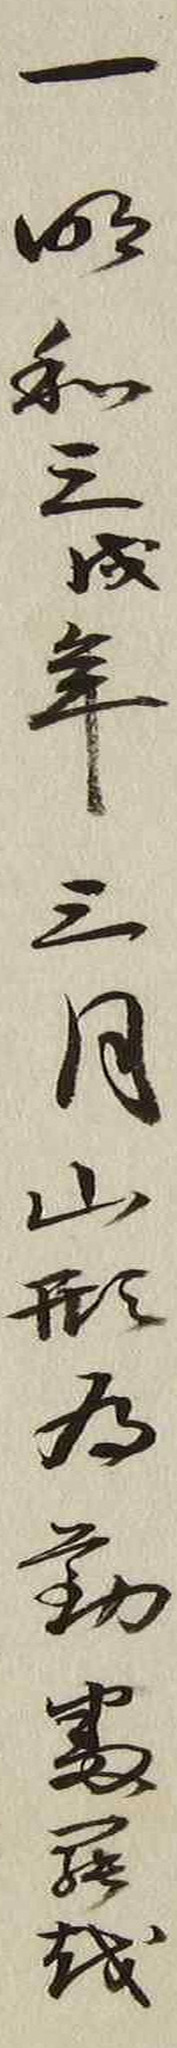一明和三戌年三月山形為勤番罷越
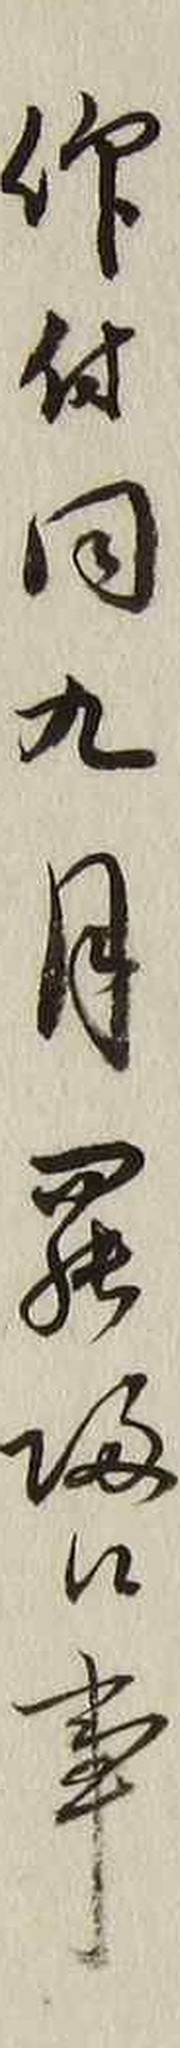仰付同九月罷帰候事
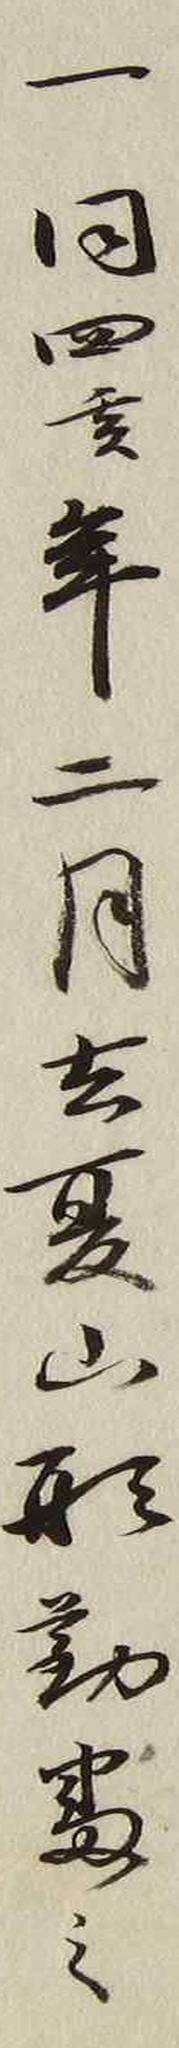一同四亥年二月去夏山形勤番之
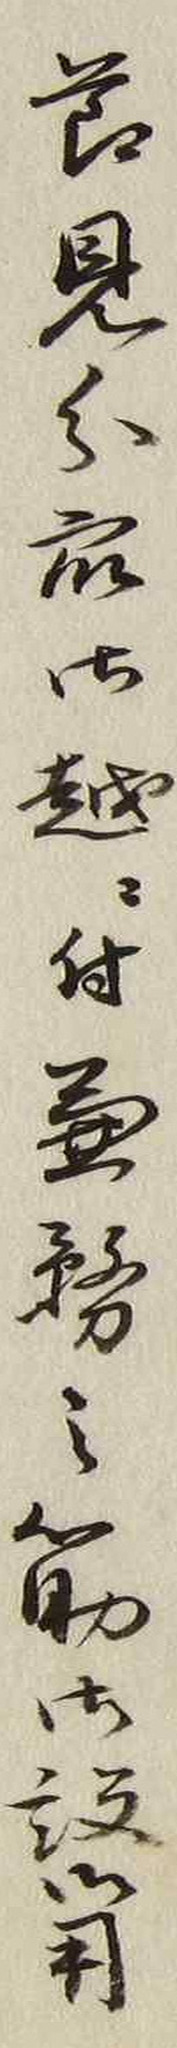節身分衆御越ニ付兼務之筋御設御用
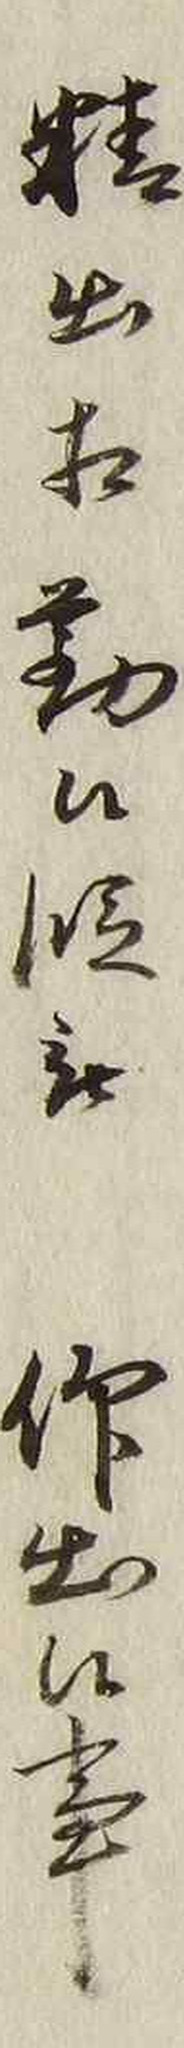精出相勤候段被仰出候事
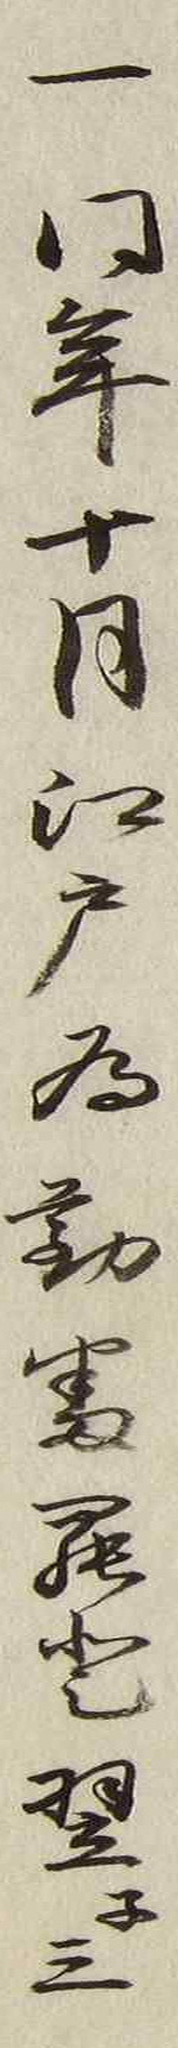一同年十月江戸為勤番罷登翌子三

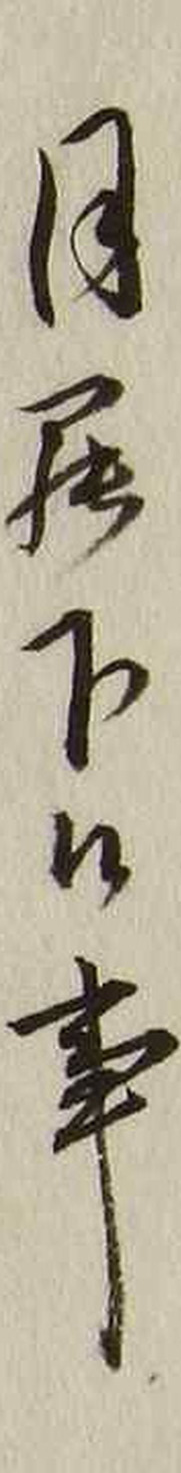月罷下候事
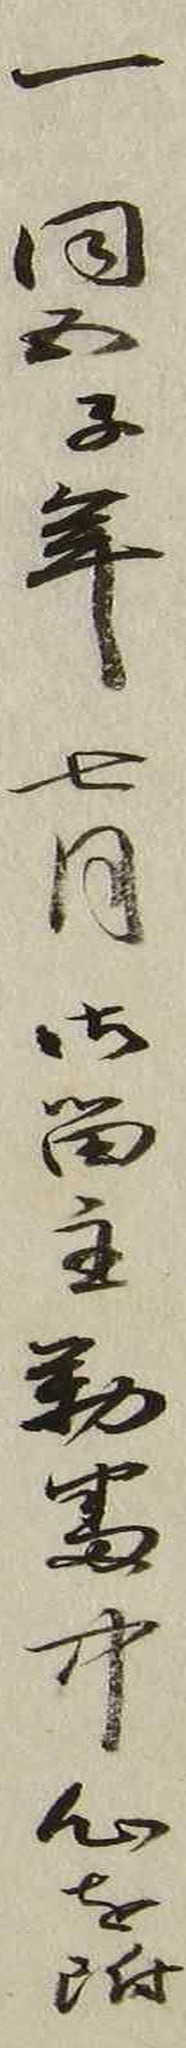一同五子年七月御留主勤番中心を附
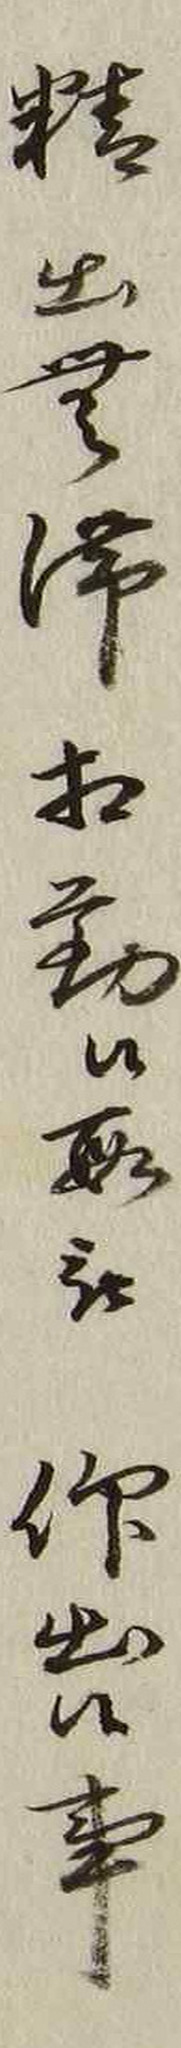精出無滞相勤候段被仰出候事
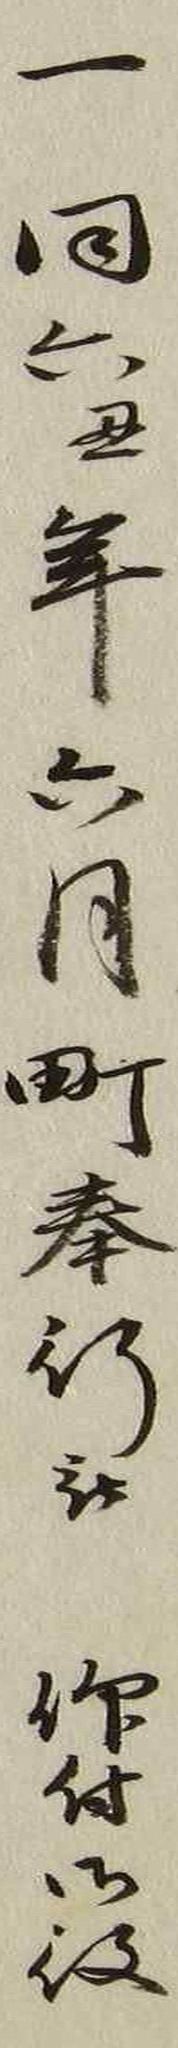一同六丑年六月町奉行被仰付御役
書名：諸士系譜　巻之160　な之部2
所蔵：会津若松市立会津図書館
